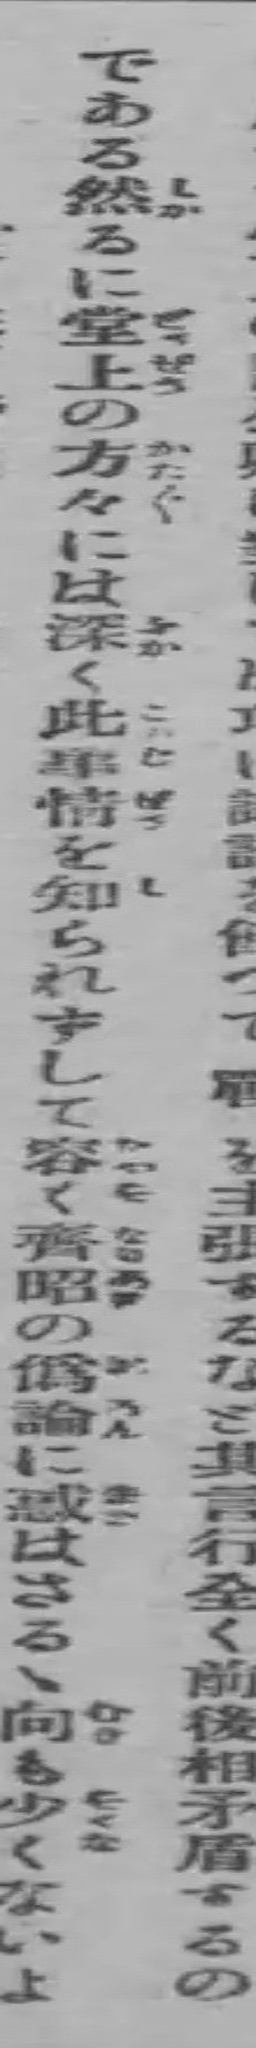である然るに堂上の方々には深く此事情を知られずして容く斉昭の偽論に惑はさるゝ向も少くないよ
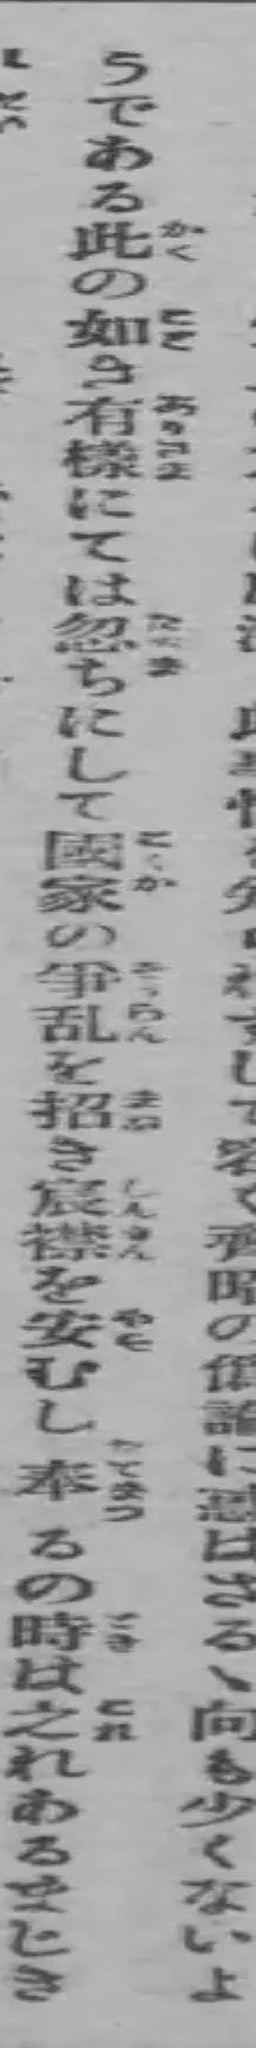うである此の如き有様にては忽ちにして国家の争乱を招き宸襟を安むし奉るの時は之れあるまじき
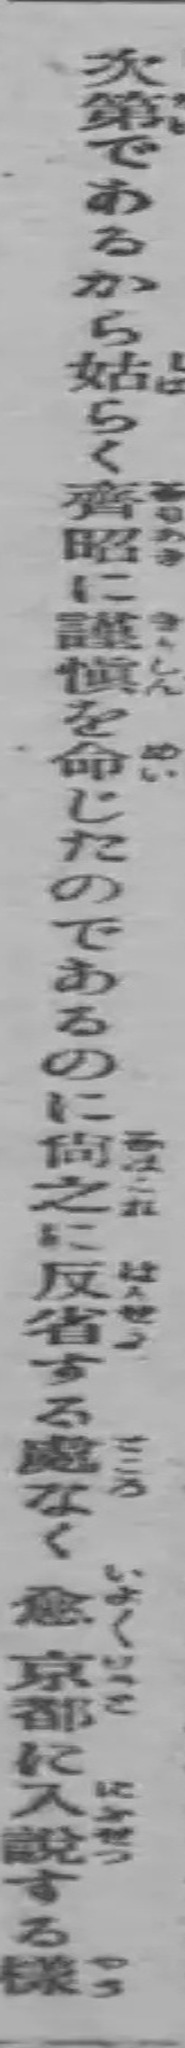次第であるから姑らく斉昭に謹慎を命じたのであるのに尚之に反省する処なく愈京都に入説する様
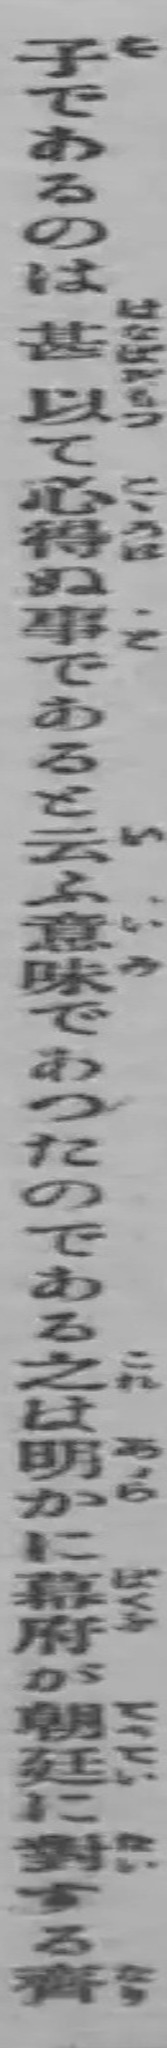子であるのは甚以て心得ぬ事であると云ふ意味であつたのである之は明かに幕府が朝廷に対する斉
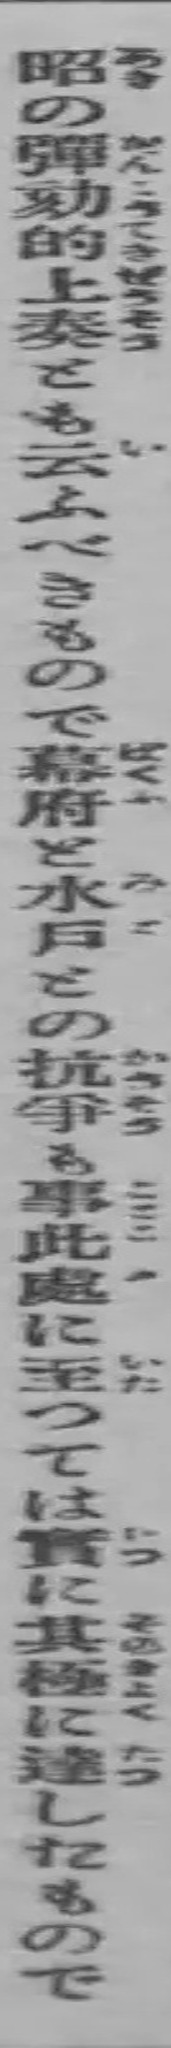昭の弾劾的上奏とも云ふべきもので幕府と水戸との抗争も事此処に至つては実に其極に達したもので
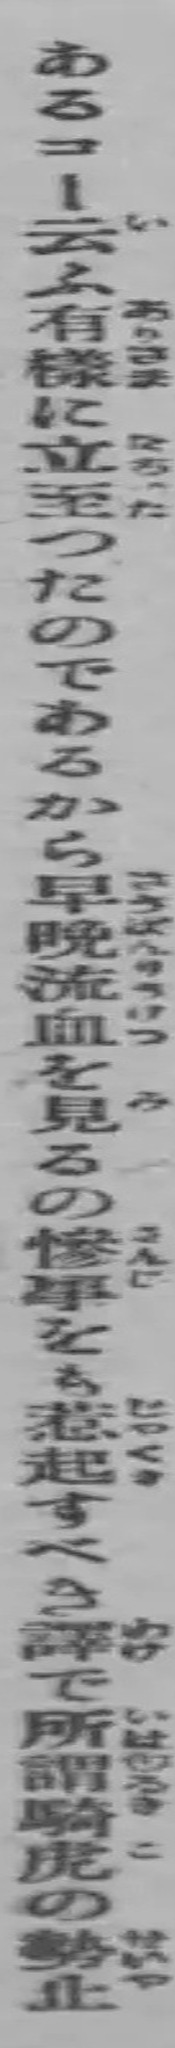あるコー云ふ有様に立至つたのであるから早晩流血を見るの惨事をも惹起すべき訳で所謂騎虎の勢止
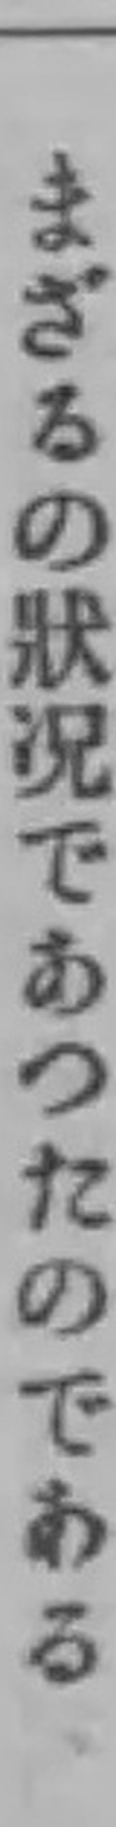まざるの状況であつたのである
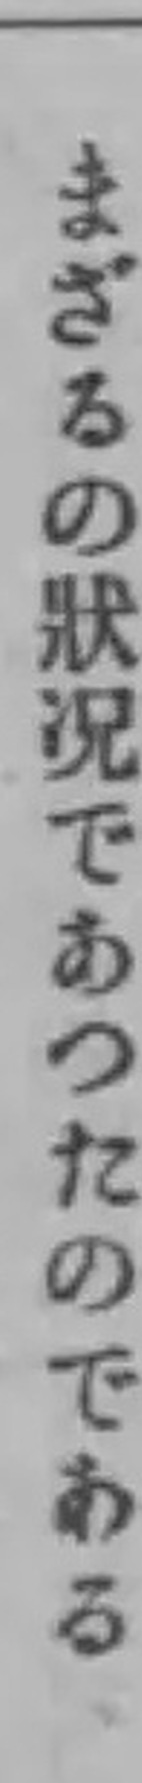まざるの状況であつたのである
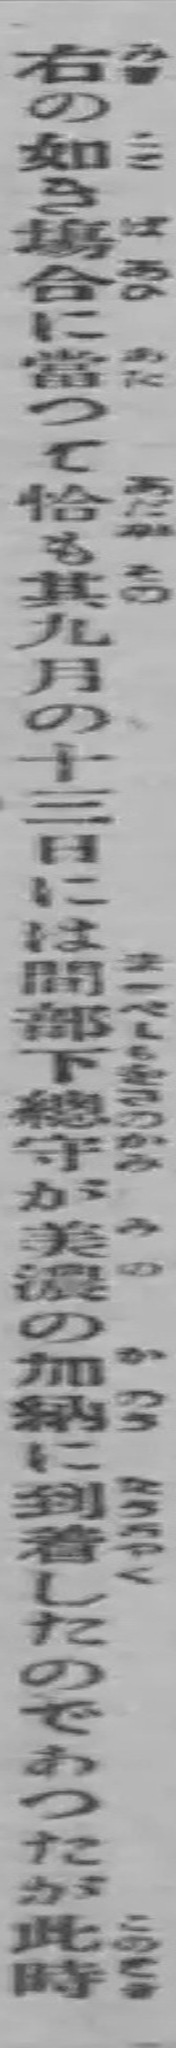右の如き場合に当つて恰も其九月の十三日には間部下総守が美濃の加納に到着したのであつたが此時
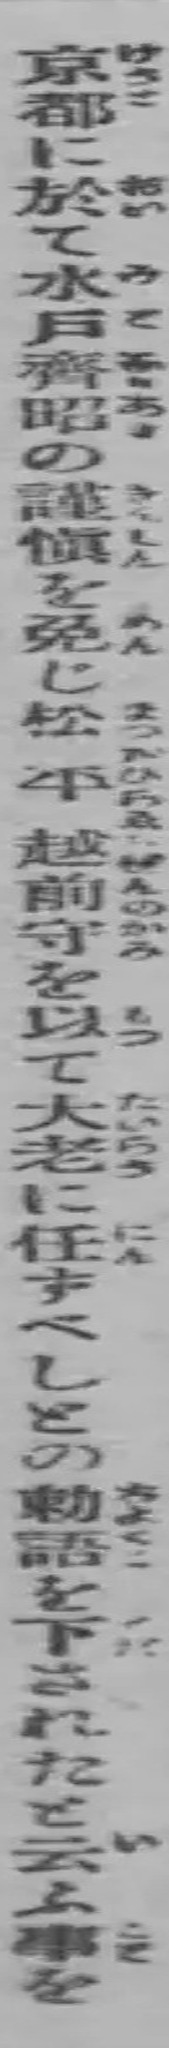京都に於て水戸斉昭の謹慎を免じ松平越前守を以て大老に任ずべしとの勅語を下されたと云ふ事を
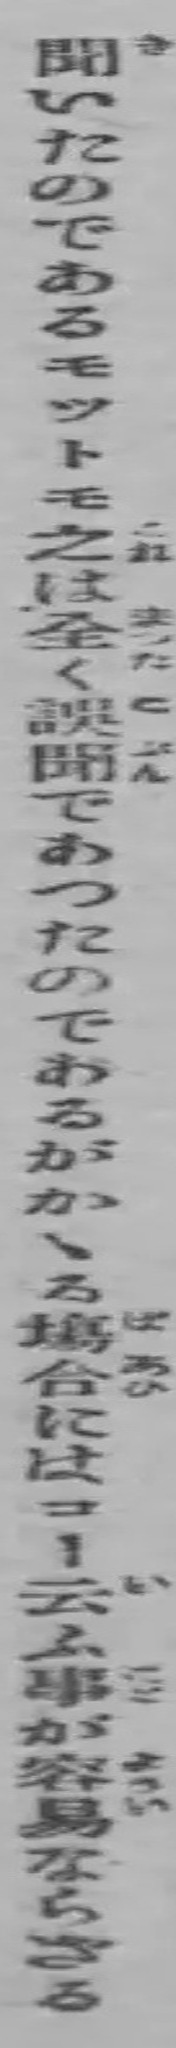聞いたのであるモツトモ之は全く誤聞であつたのであるがかゝる場合にはコー云ふ事が容易ならざる
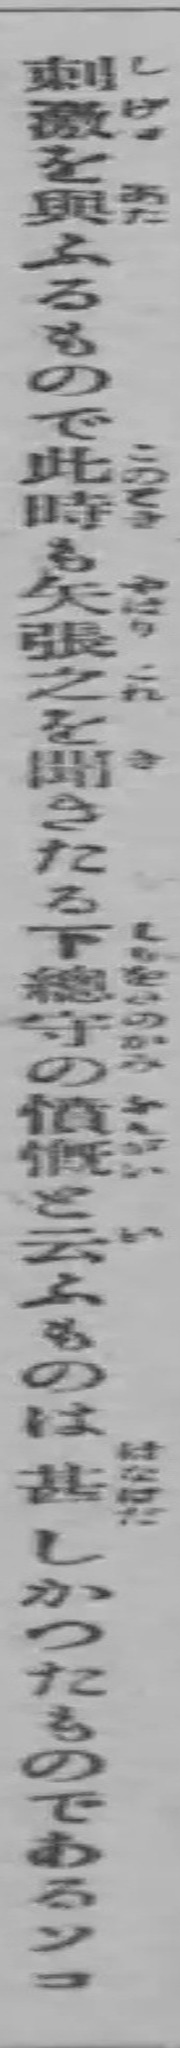刺激を与ふるもので此時も矢張之を聞きたる下総守の憤慨と云ふものは甚しかつたものであるソコ
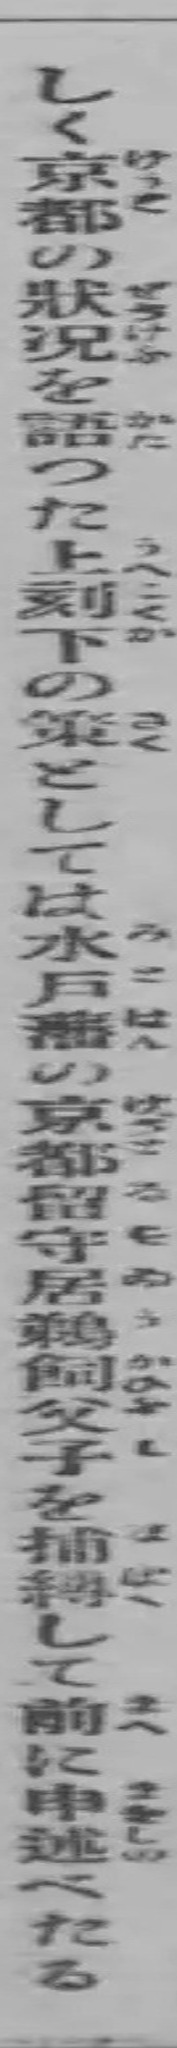しく京都の状況を語つた上刻下の策としては水戸藩の京都留守居鵜飼父子を捕縛して前に申述べたる
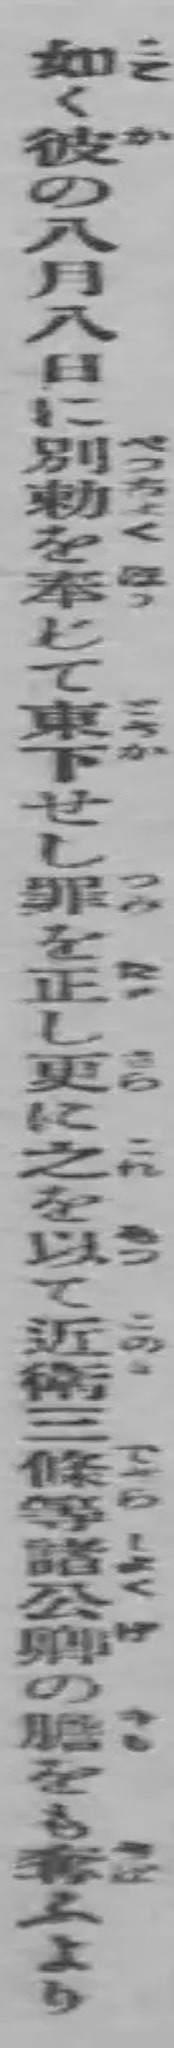如く彼の八月八日に別勅を奉じて東下せし罪を正し更に之を以て近衛三条等諸公卿の膽をも奪ふより
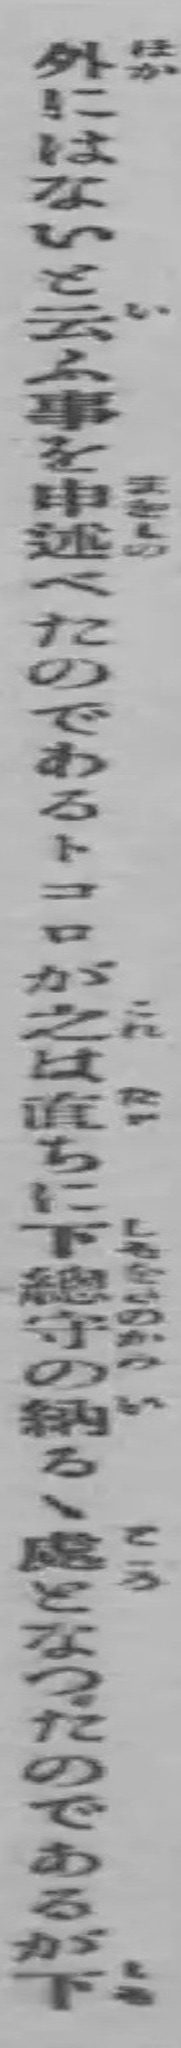外にはないと云ふ事を申述べたのであるトコロが之は直ちに下総守の納るゝ処となつたのであるが下
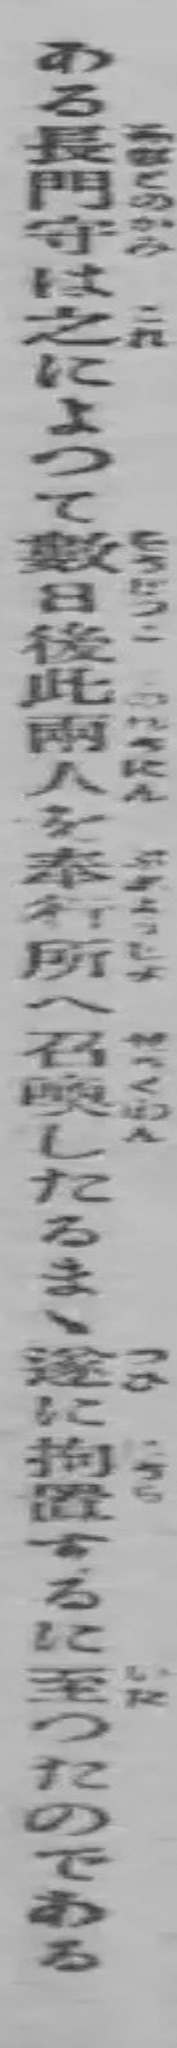ある長門守は之によつて数日後此両人を奉行所へ召喚したるまゝ遂に拘置するに至つたのである
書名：豊橋市史談
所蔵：国立国会図書館 National Diet Library, JAPAN
